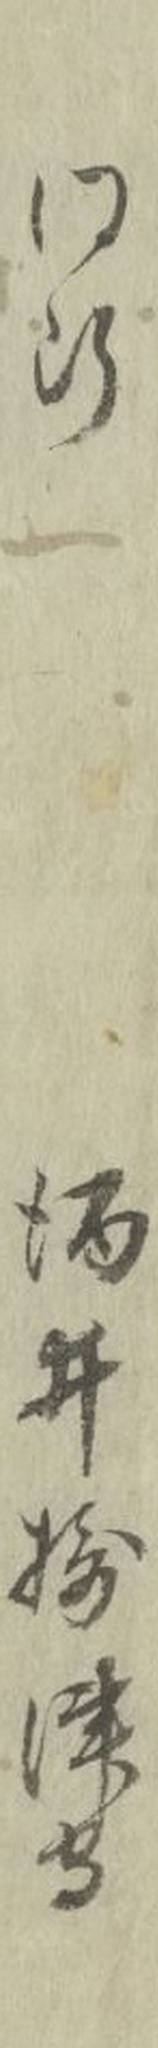同断酒井摂津守
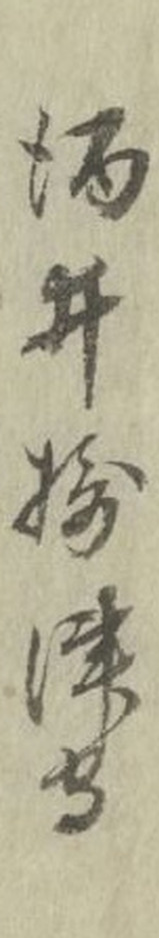同断酒井摂津守
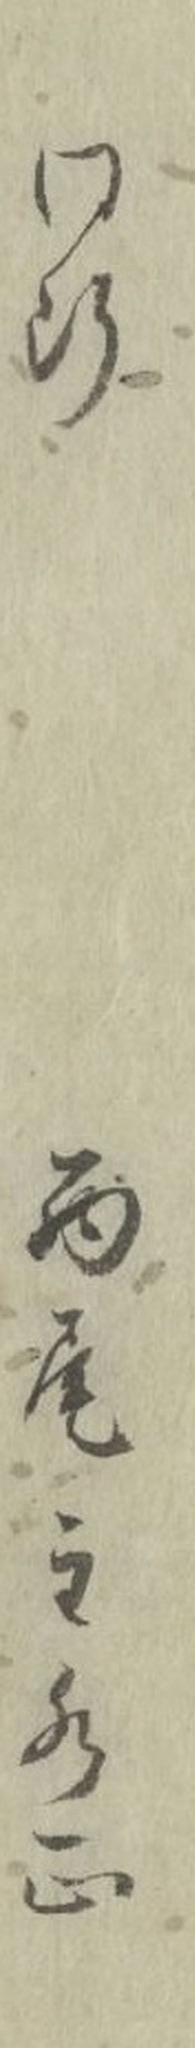同断西尾主水正

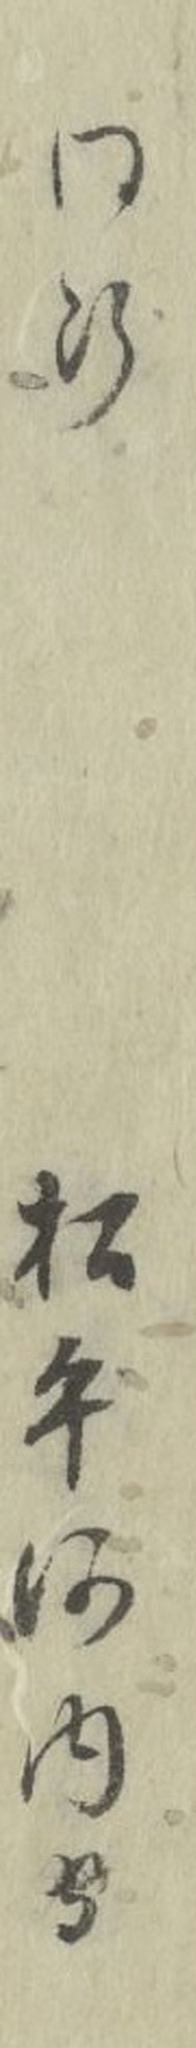同断松平河内守
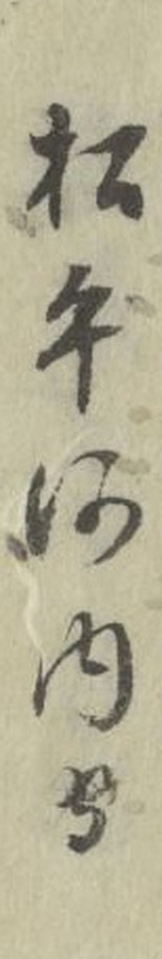同断松平河内守
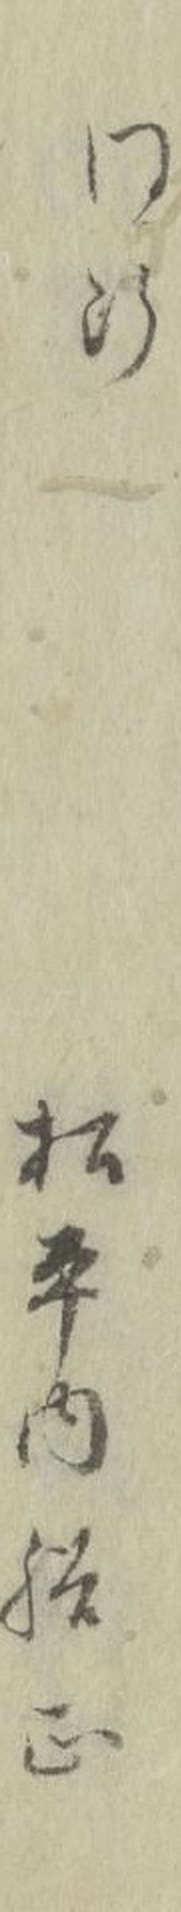同断松平内膳正
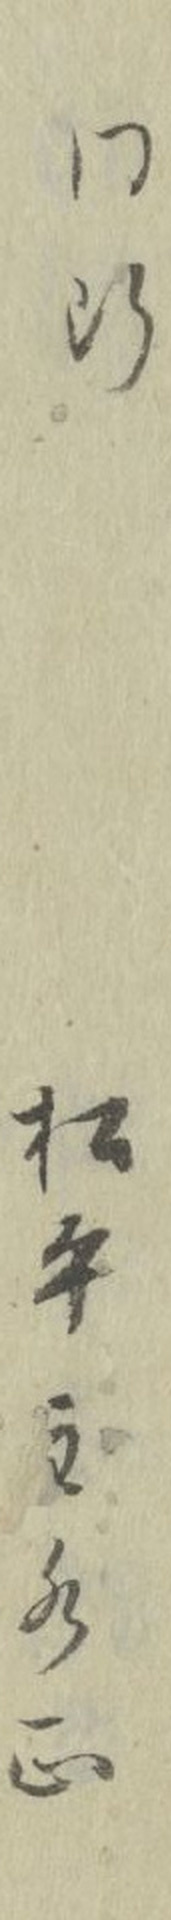同断松平主水正
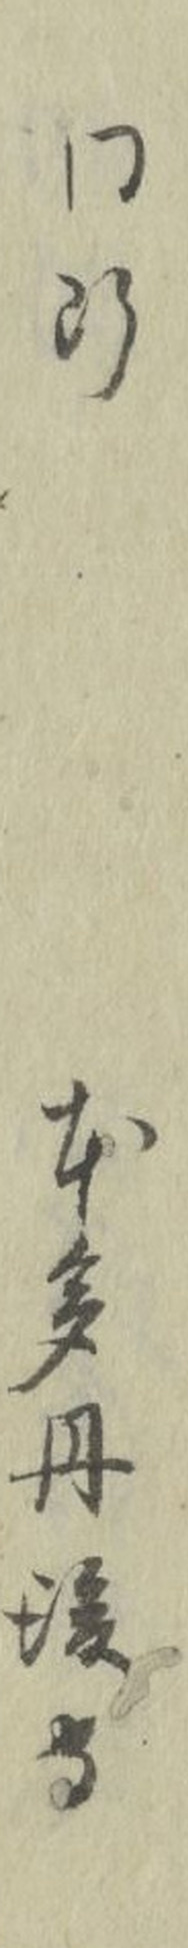同断本多丹後守
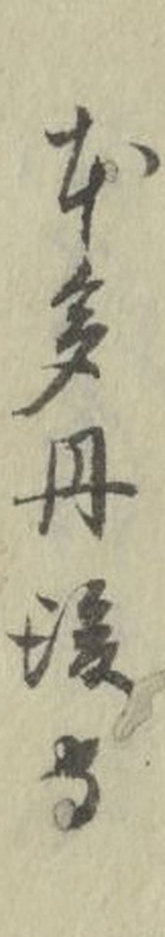同断本多丹後守
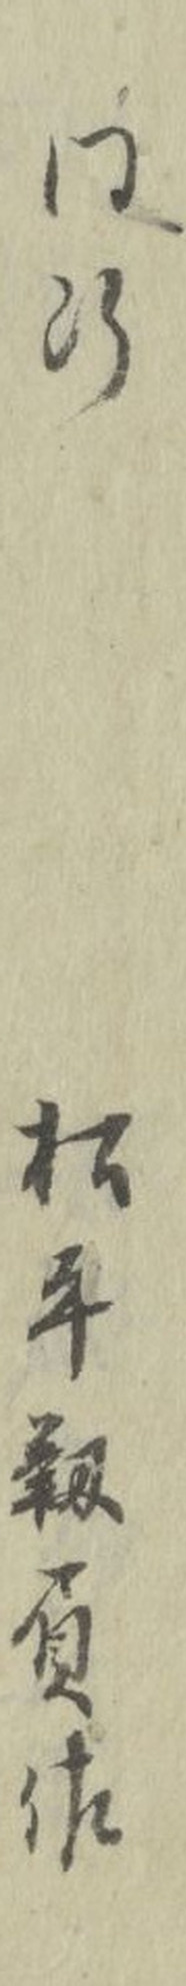同断松平靭負佐
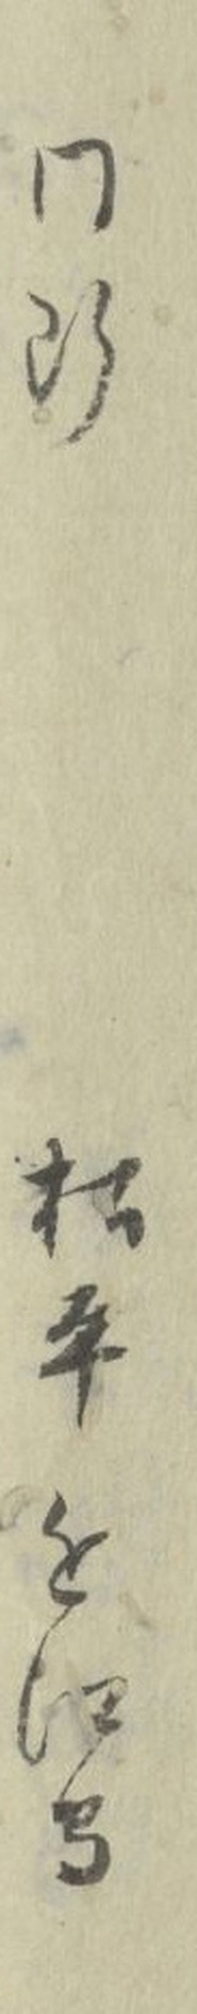同断松平近江守
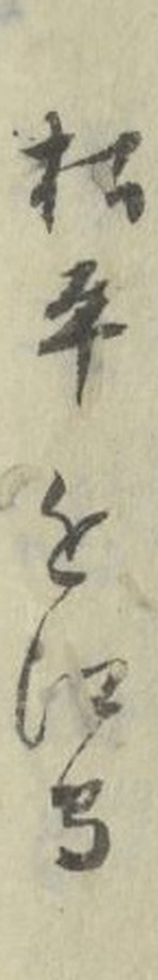同断松平近江守
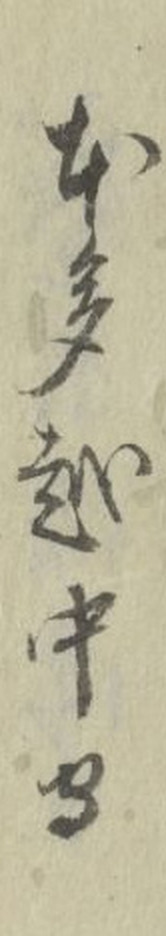同断本多越中守
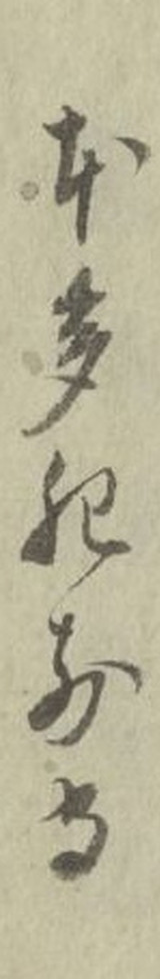同断本多肥前守

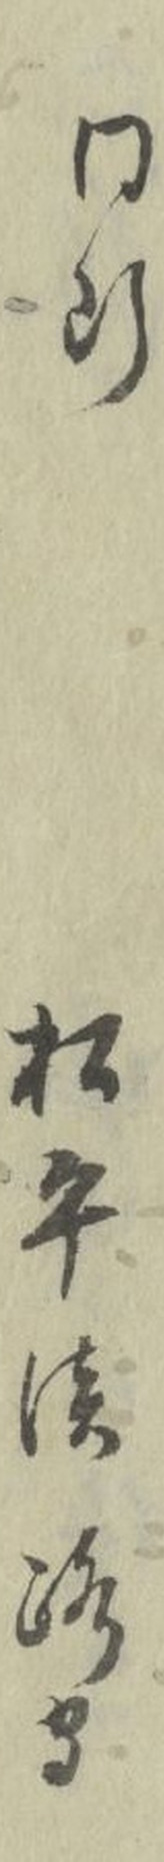同断松平淡路守
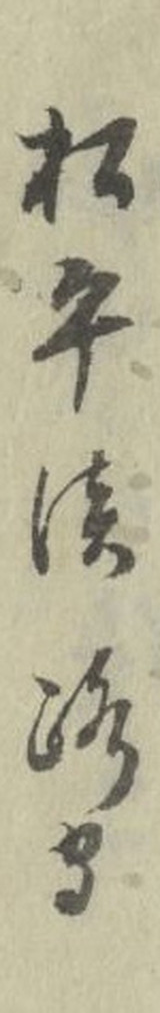同断松平淡路守
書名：琉球来朝記 自一至七
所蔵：University of the Ryukyus Library
